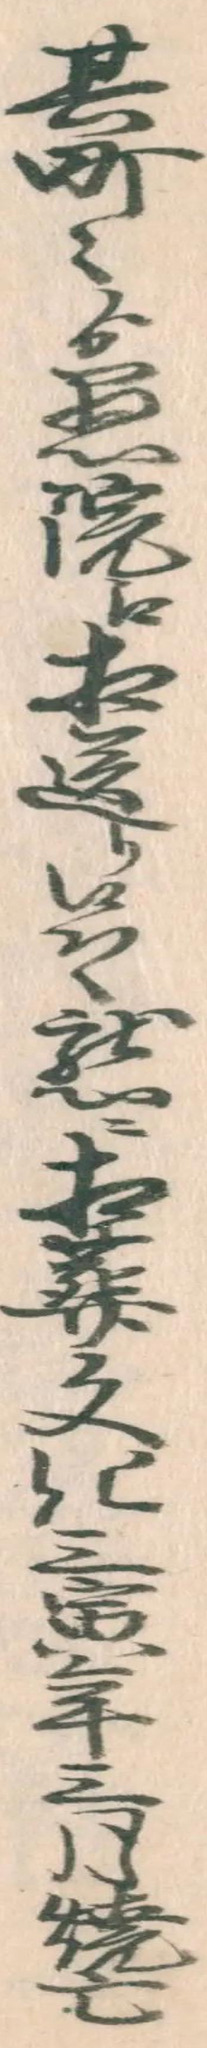其町〻ゟ愚院え相送り候ハヽ懇ニ相葬文化三寅年三月焼亡
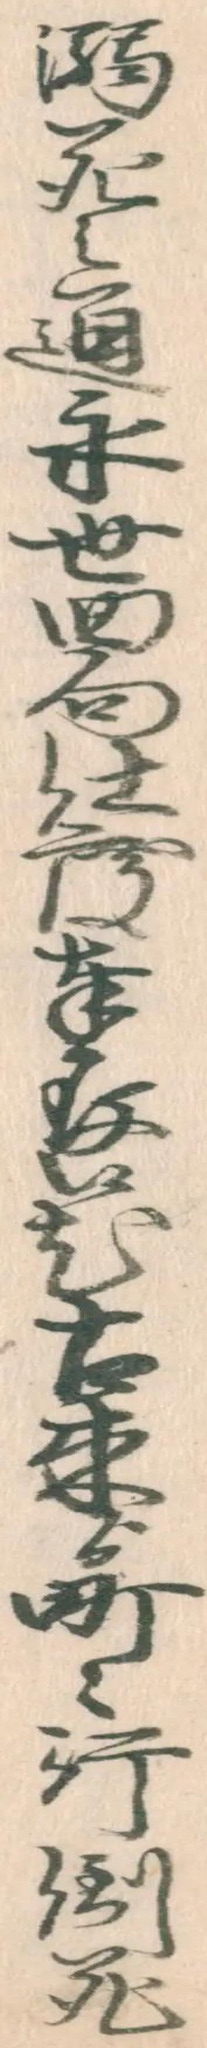溺死之通永世回向仕度奉存候尤古来ゟ町〻行倒死
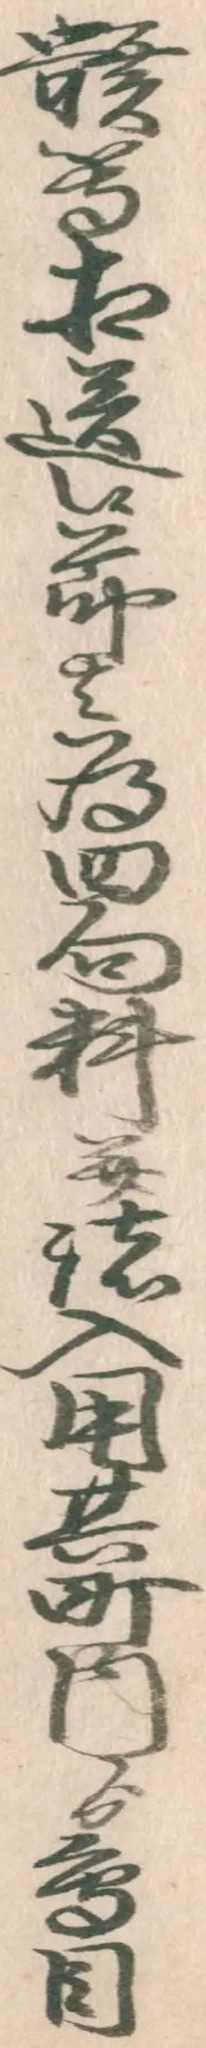骸等相送候節は為回向料幷諸入用其町内ゟ鳥目

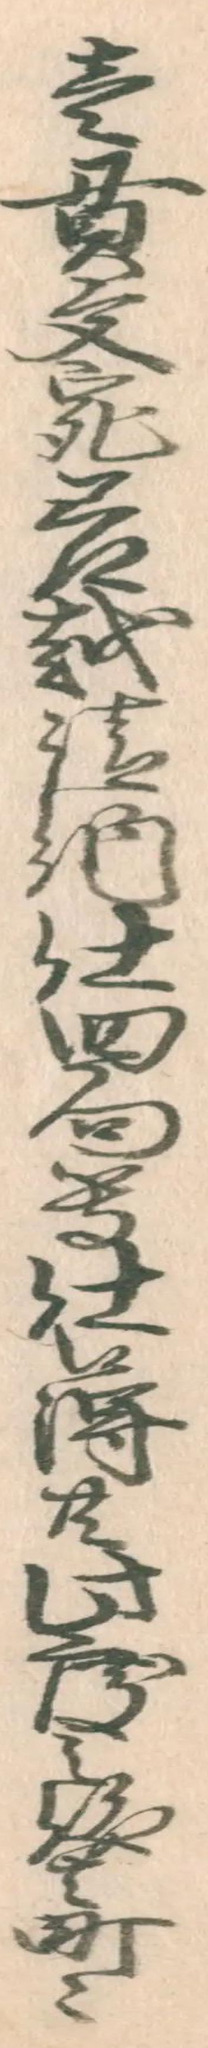壱貫文宛差越請納仕回向等仕候得共此度之儀は町〻
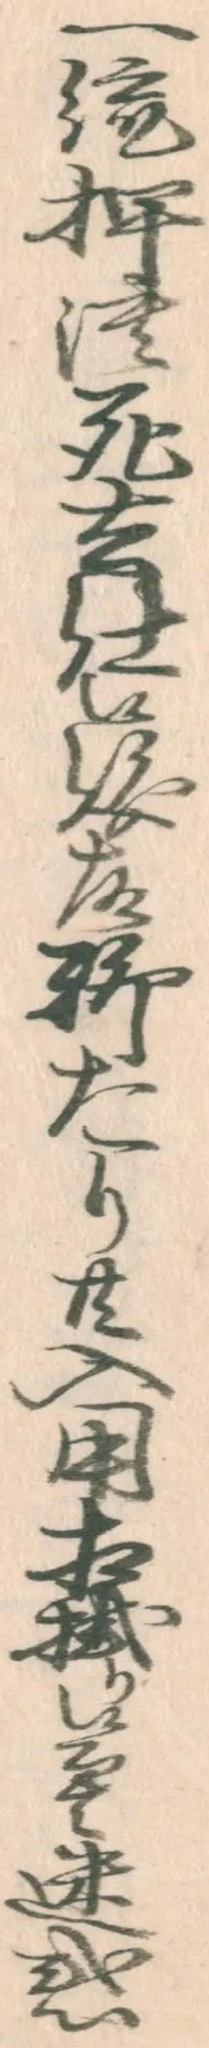一統押潰死去同仕候儀故聊たり共入用相掛候ては迷惑
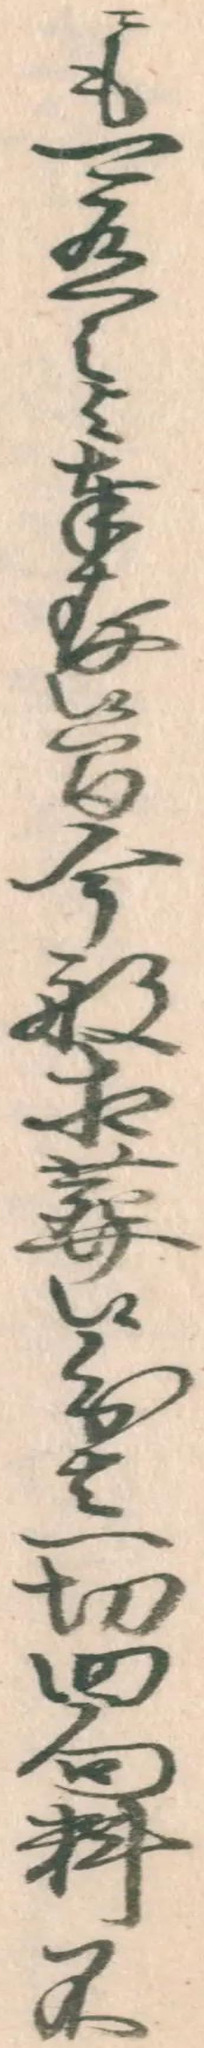ニも可有之と奉存候間今般相葬候分は一切回向料不
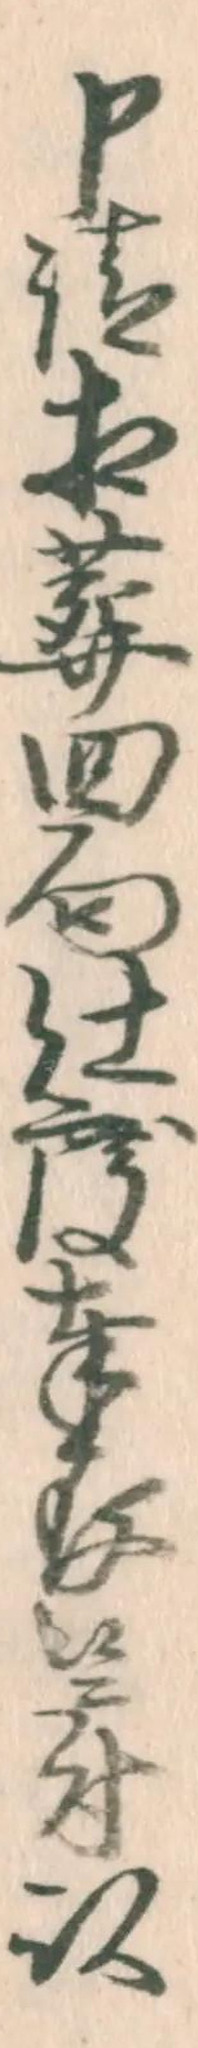申請相葬回向仕度奉存候ニ付以
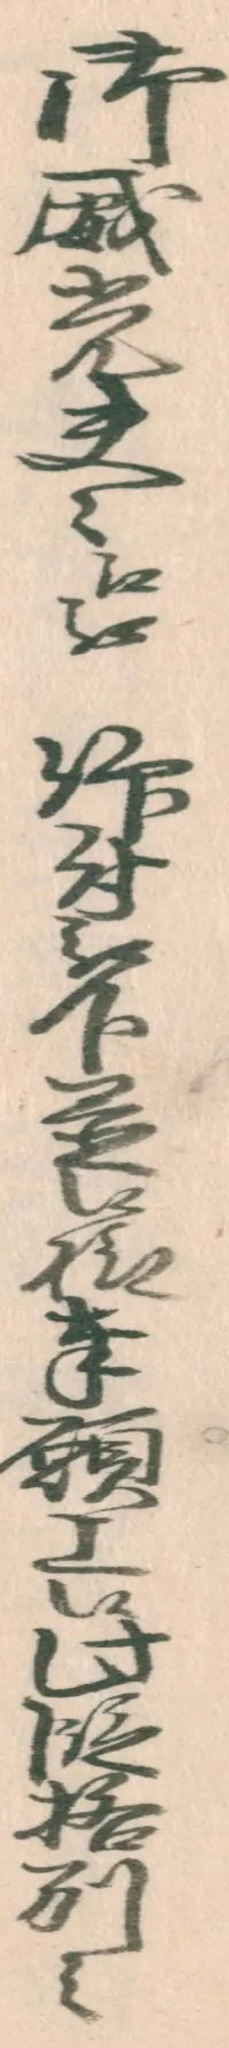御威光夫〻え被仰付被下置候様奉願上候此段格別之
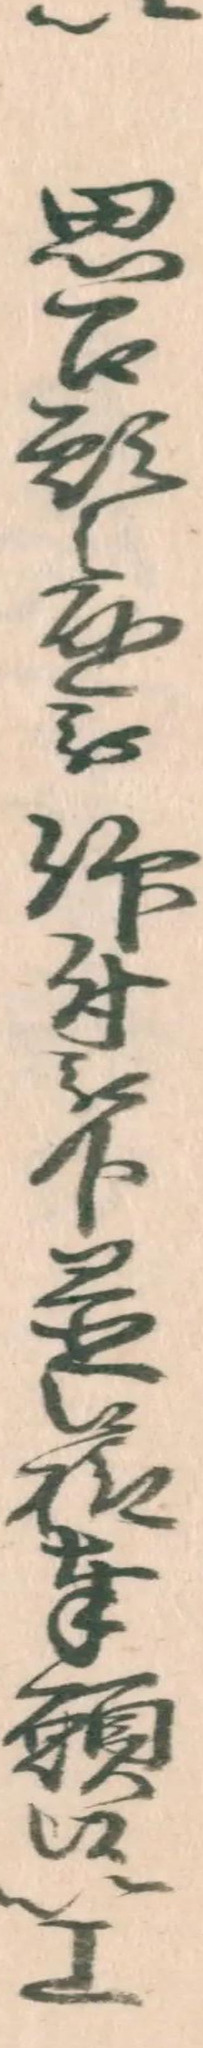以思召願之通被仰付被下置候様奉願候以上
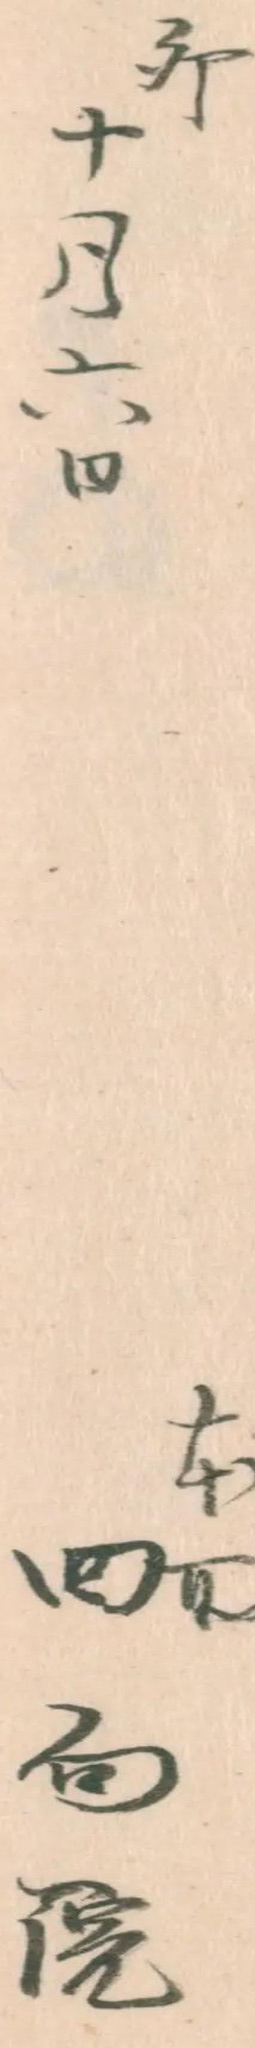十月六日回向院
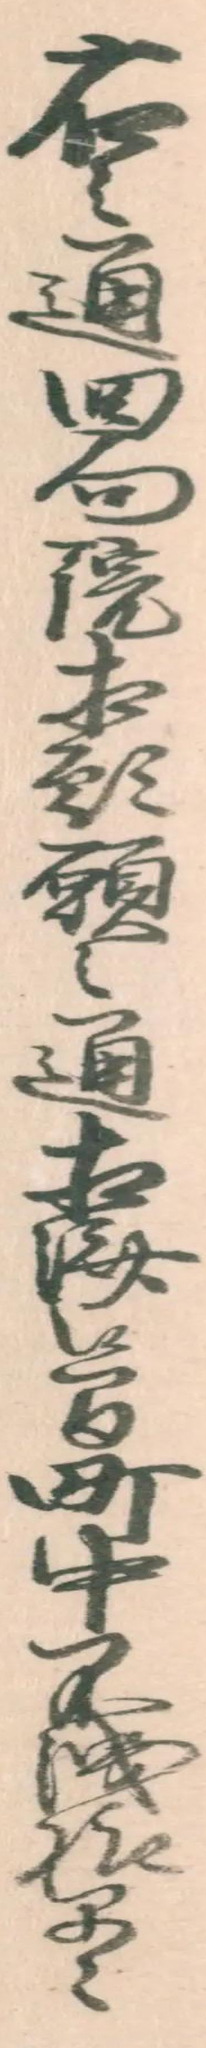右之通回向院相歎願之通相済候間町中不洩様早〻
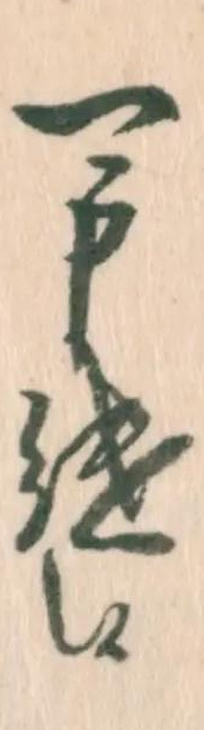可申継候
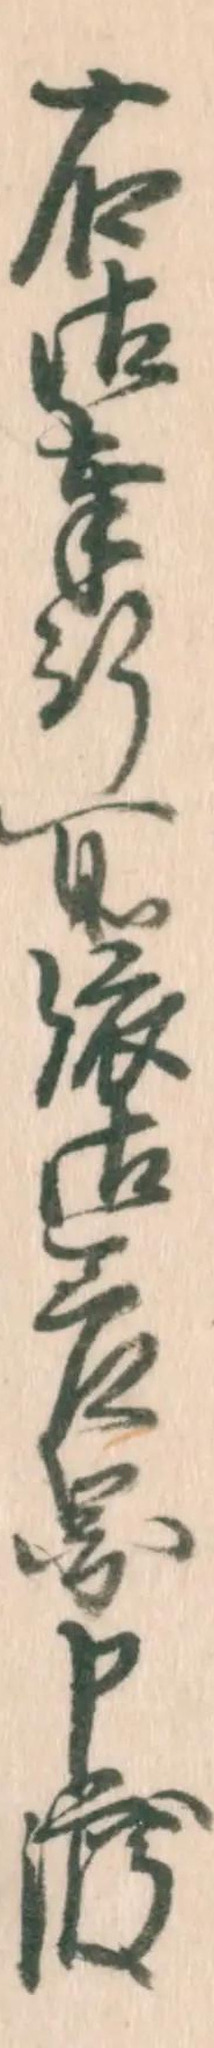右御奉行所依御差図申渡
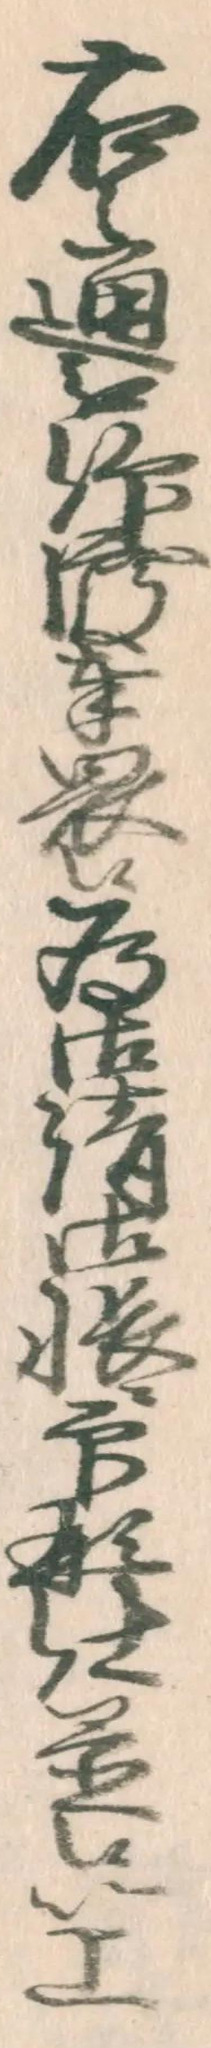右之通被仰渡奉畏候為御請御帳ニ印形仕置候以上
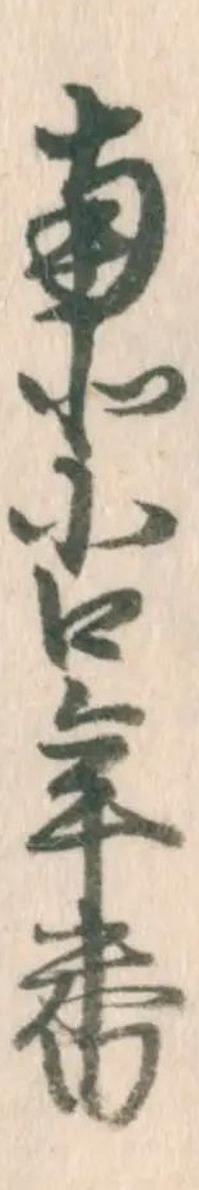南北小口年番
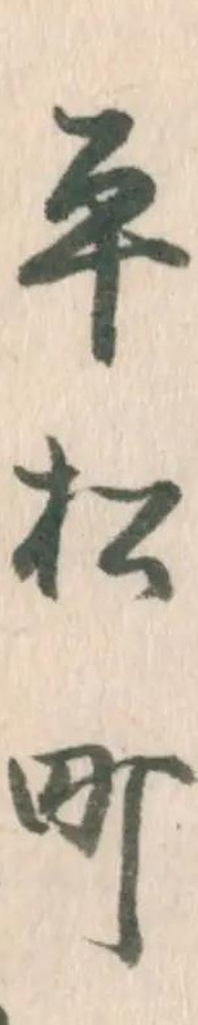平松町
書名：地震災書留 2巻. [2] 内表紙に「地震一件　安政二卯年十月」とあり
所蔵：国立国会図書館 National Diet Library, JAPAN
